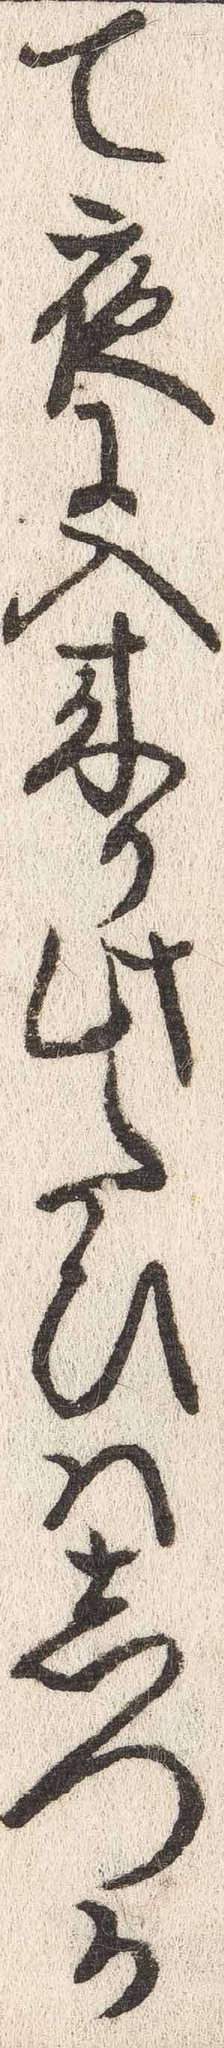て夜には入来り此たひはしつか
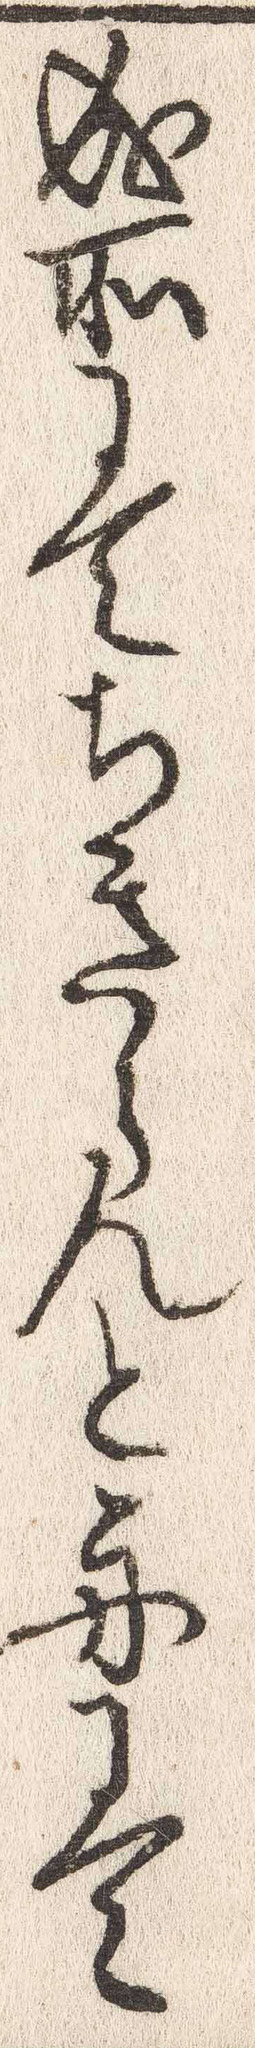成所にてちきらんと舟にて
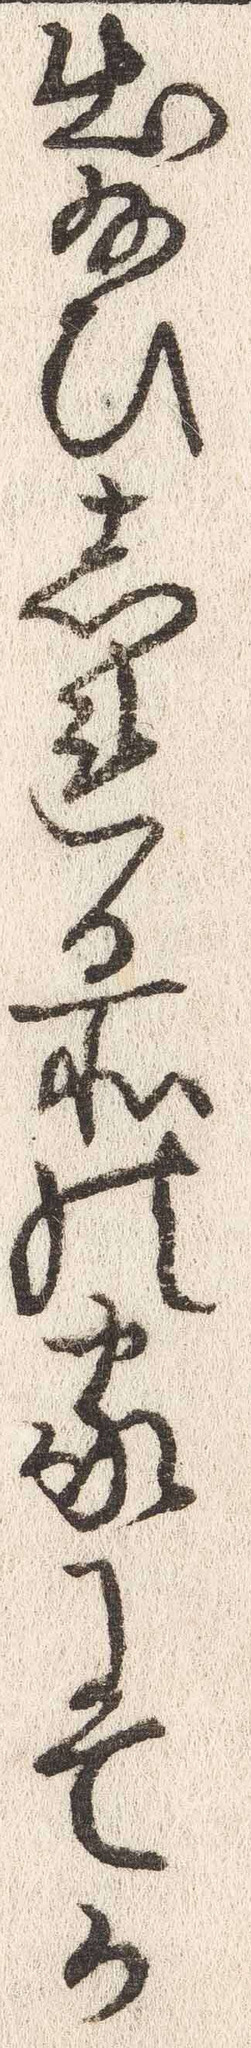出給ひしれる所の家にてか
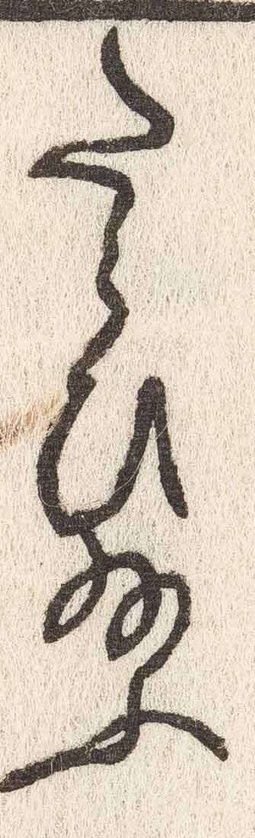たらひ給ふ
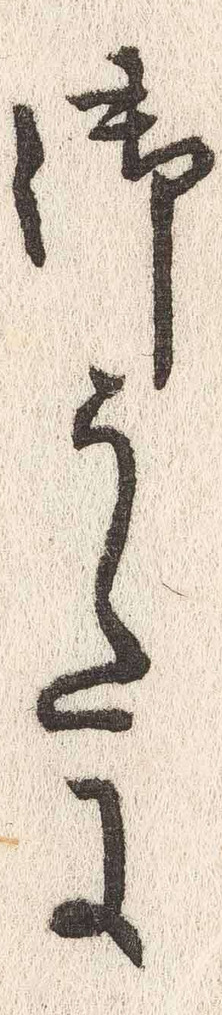御うたに
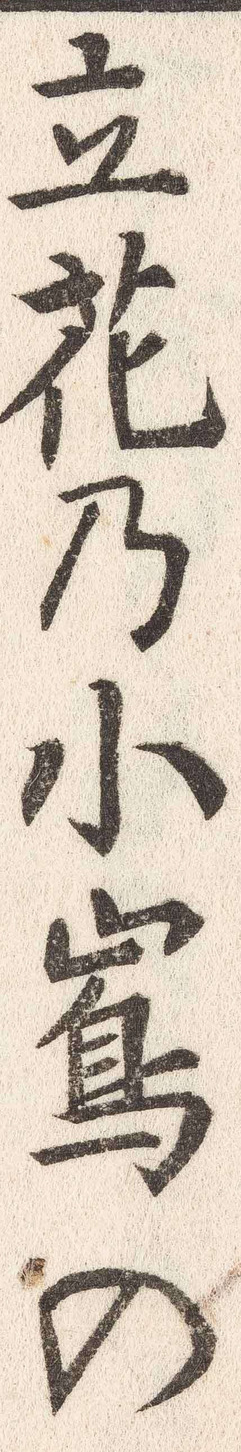立花の小島の
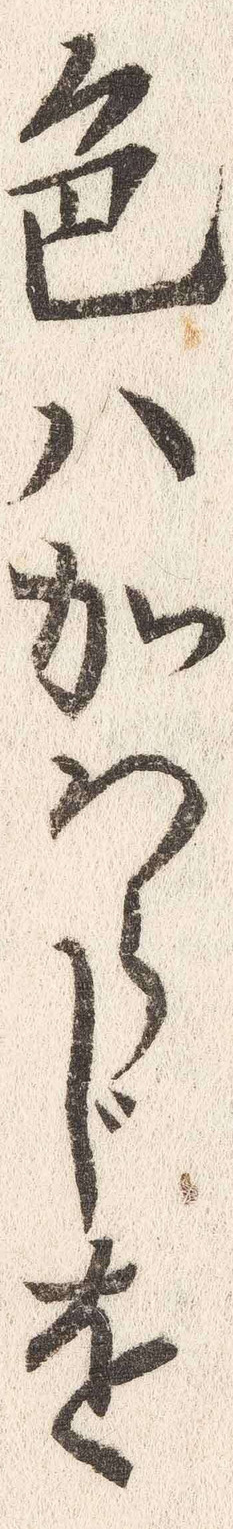色はかはらじを
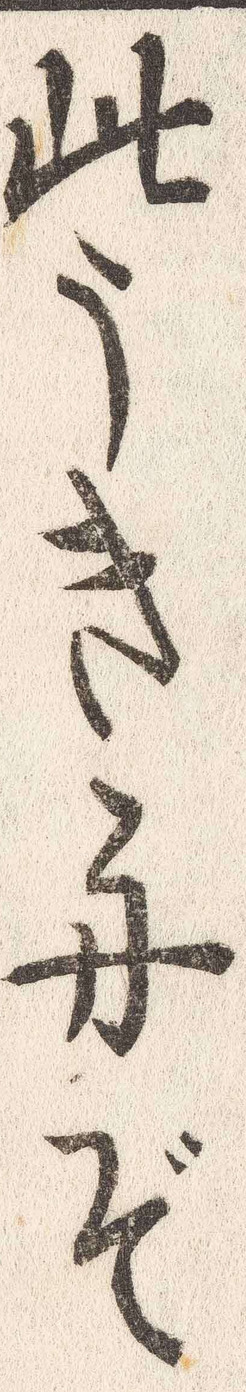此うき舟ぞ
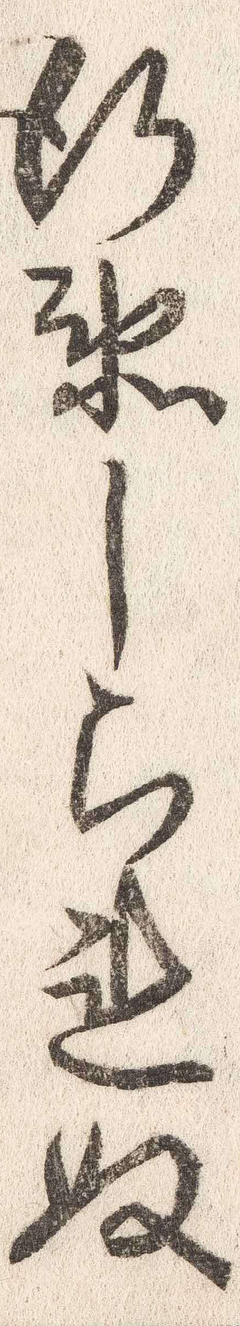行衛しられぬ

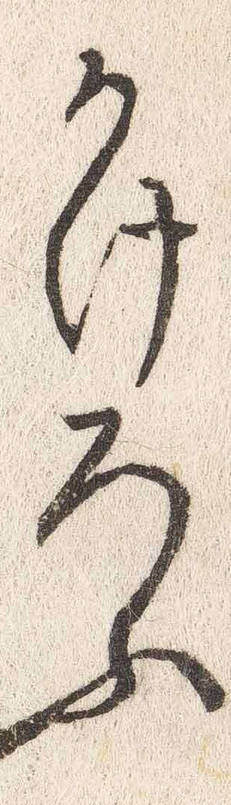かけろふ
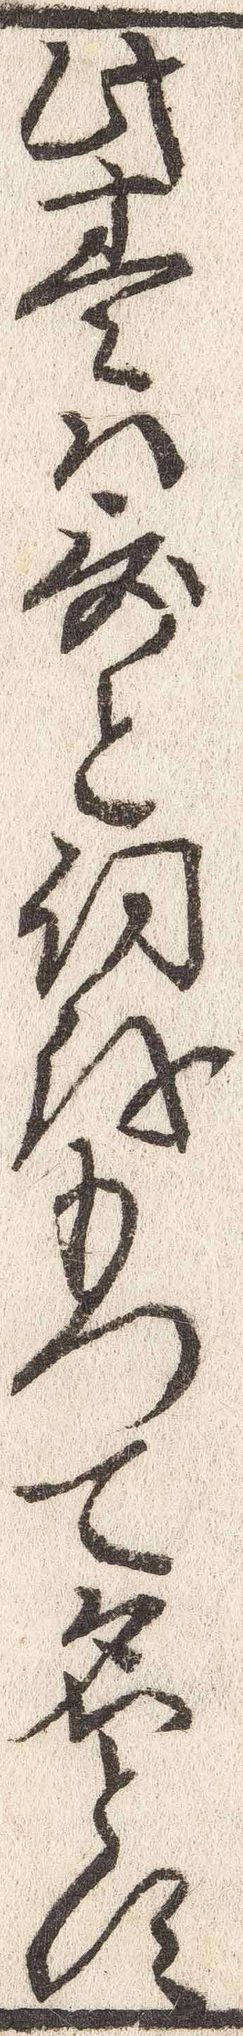此巻は歌と詞をもつて名とす
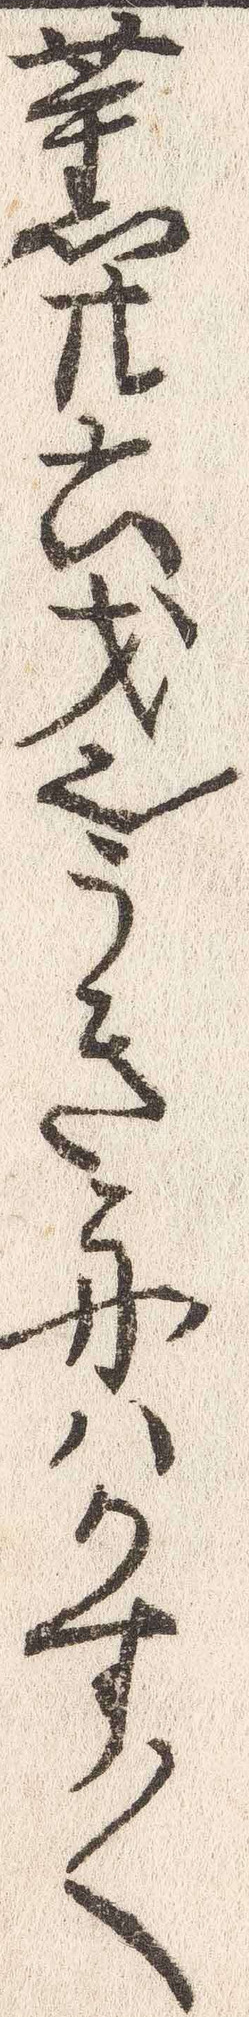薫廿六才也うき舟はかす〳〵
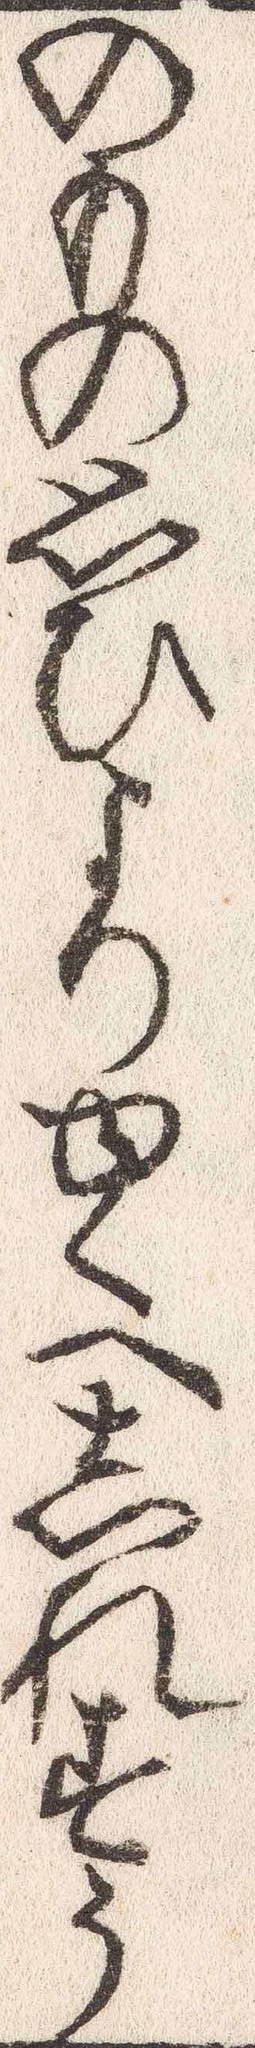のもの思ひよりゆくへしれすう
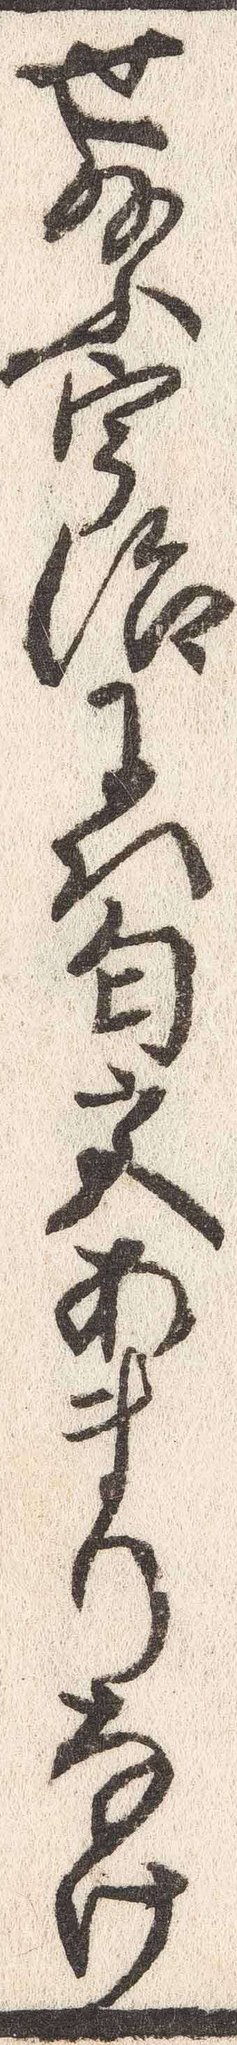せ給ふ宇治には匂宮あまりなけ
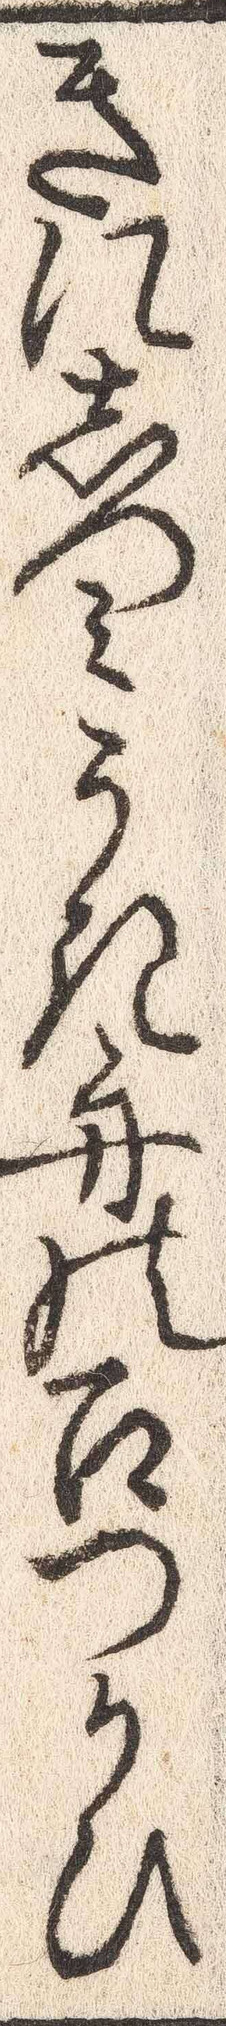きにしつみうき舟の召つかひ
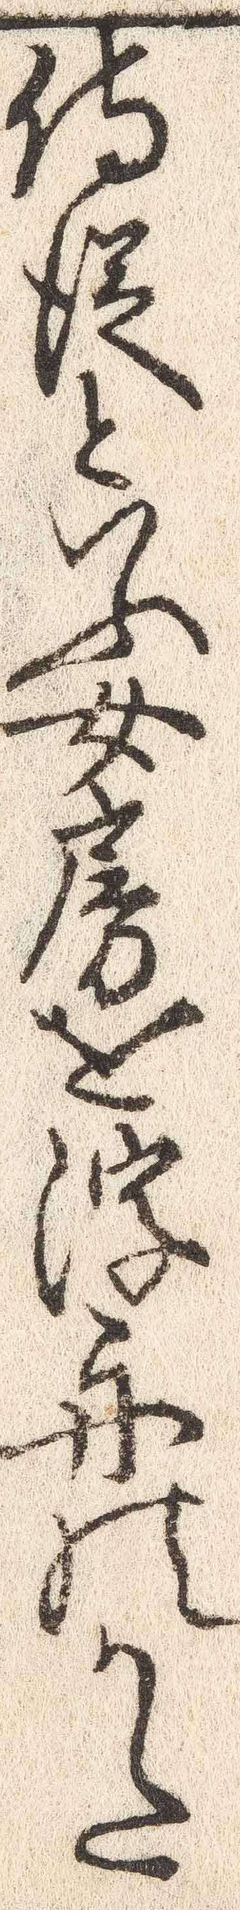侍といふ女房を浮舟のかた
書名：源氏物語
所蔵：東京学芸大学附属図書館 国文学研究資料館
